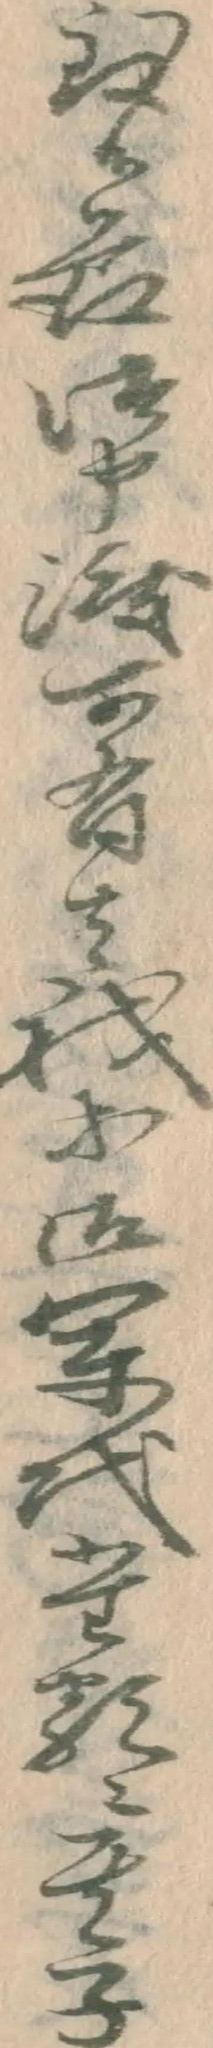致候節御申渡可有者我等御軍越堂類に其子
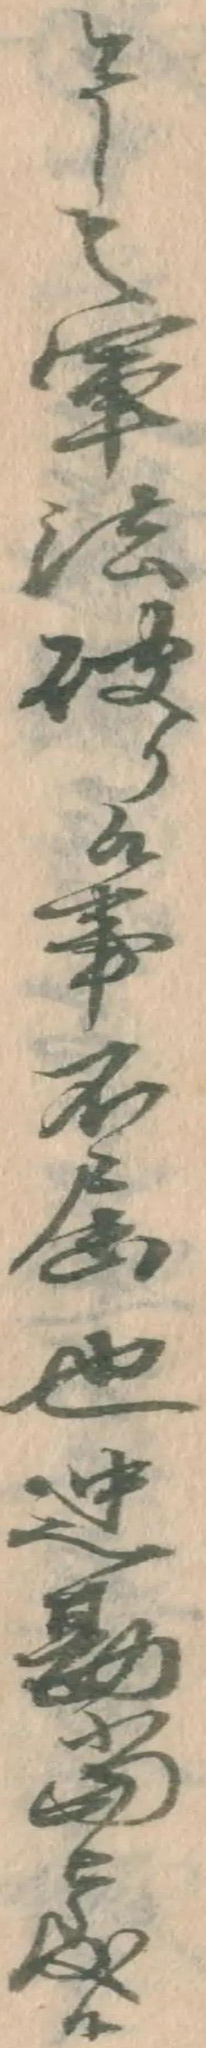として軍法破り候事不届也迚勘当被成候

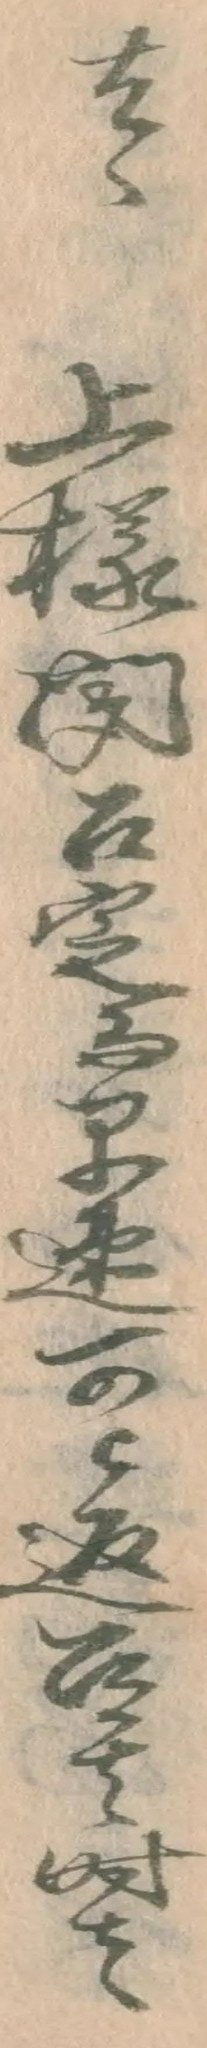者々上様聞召定而早速可被返召其時者
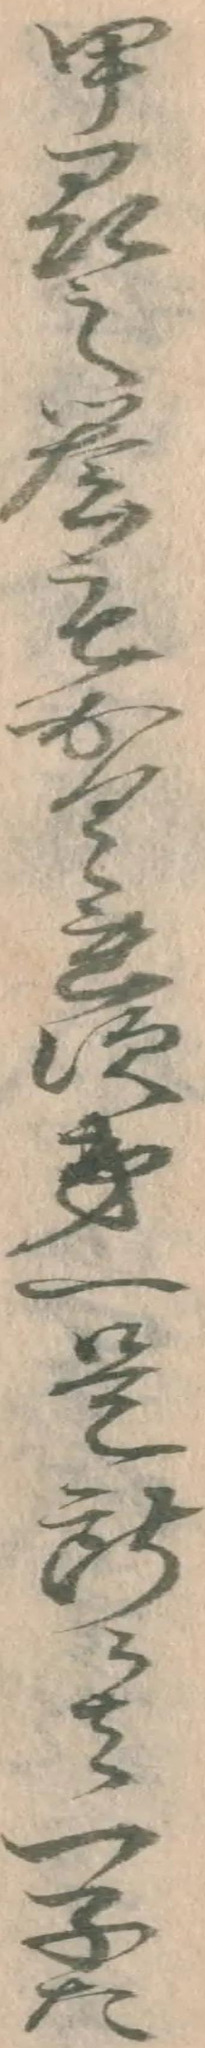甲州之誉もか具連須第一是所に者一子た
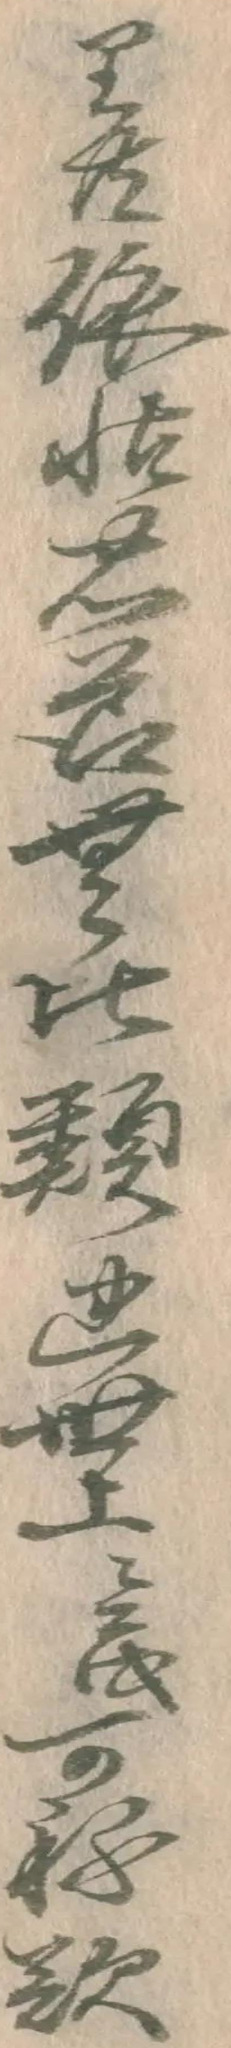里共依怙忠節無比類迚世上に茂可称歎
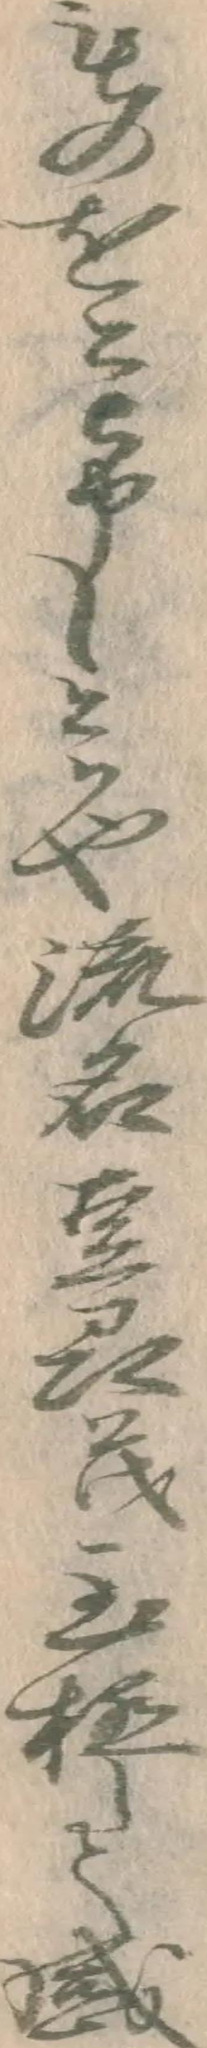ものをと被申しとかや流名豆州も至極して感
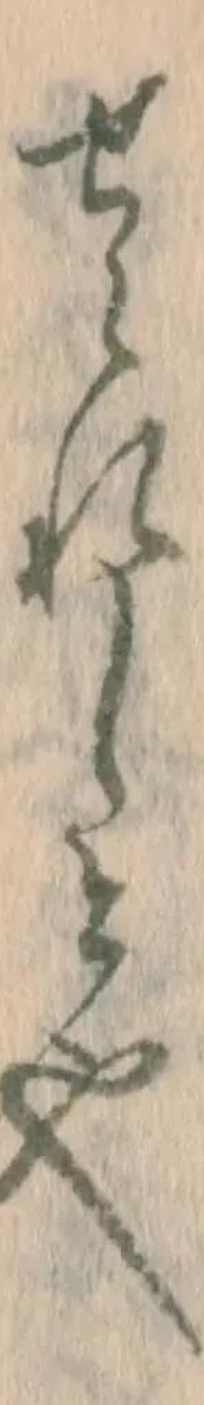せられしと也
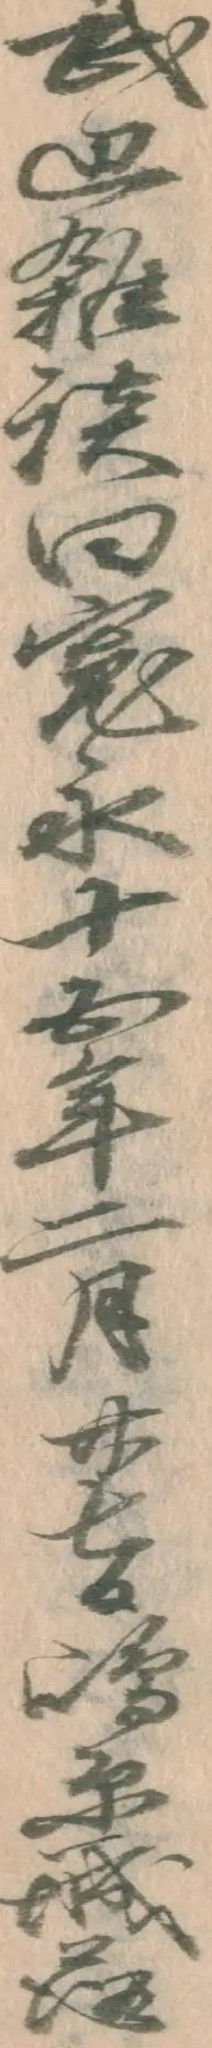武辺雑談曰寛永十五年二月廿七日島原城落
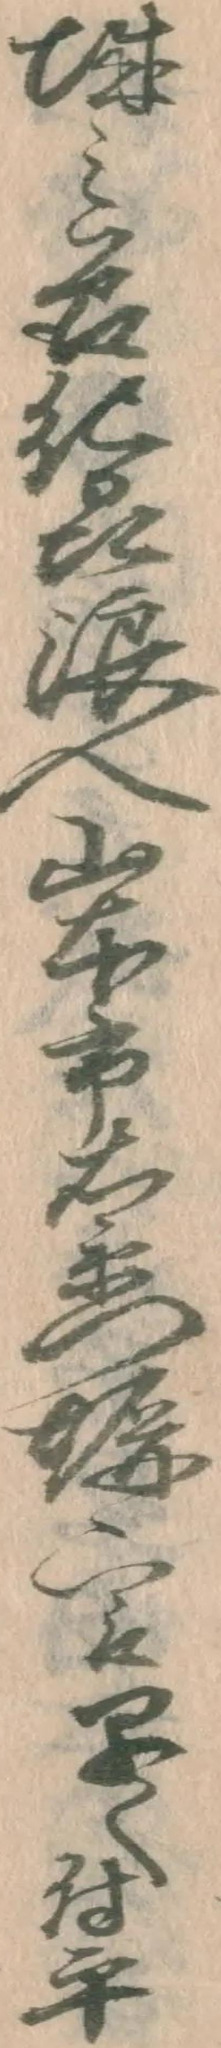城之節紀州浪人山本市右衛門塀最早く付平
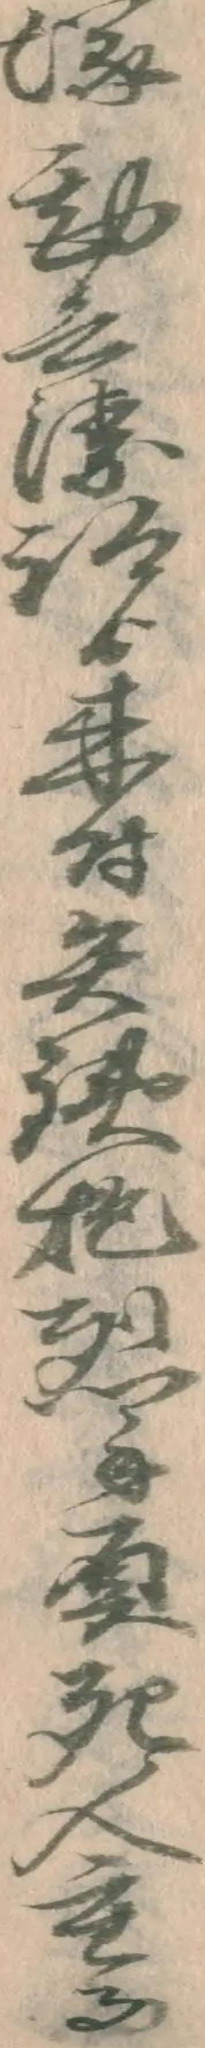塚勘兵衛跡ゟ来付矢鉄砲烈手負死人重而
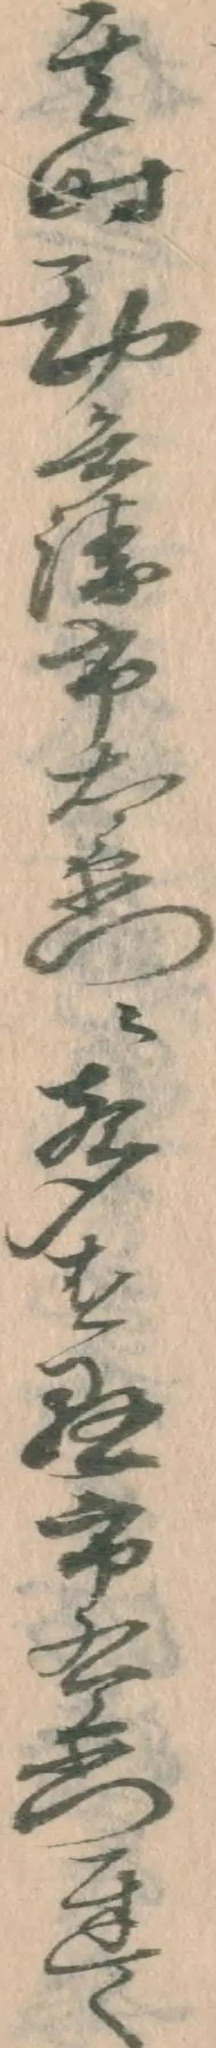其時勘兵衛市右衛門に声を懸市右衛門遅く
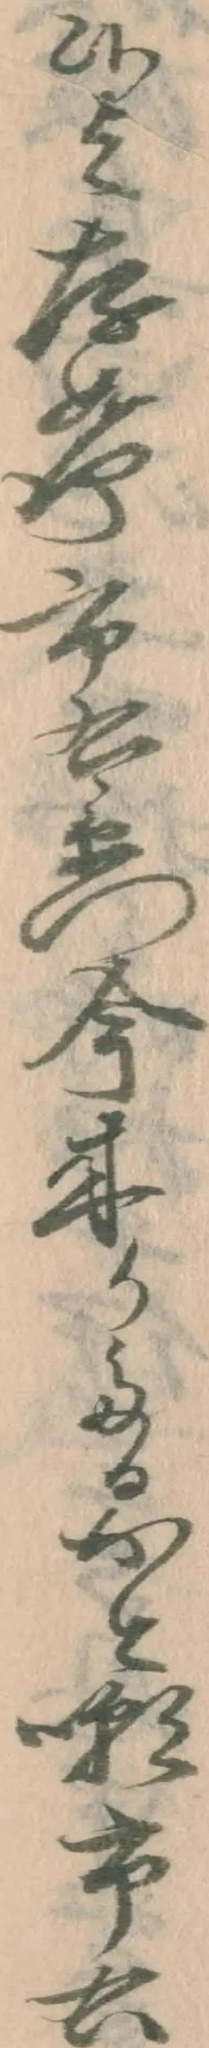候与存如何市右衛門今来り多るかと嘲市右
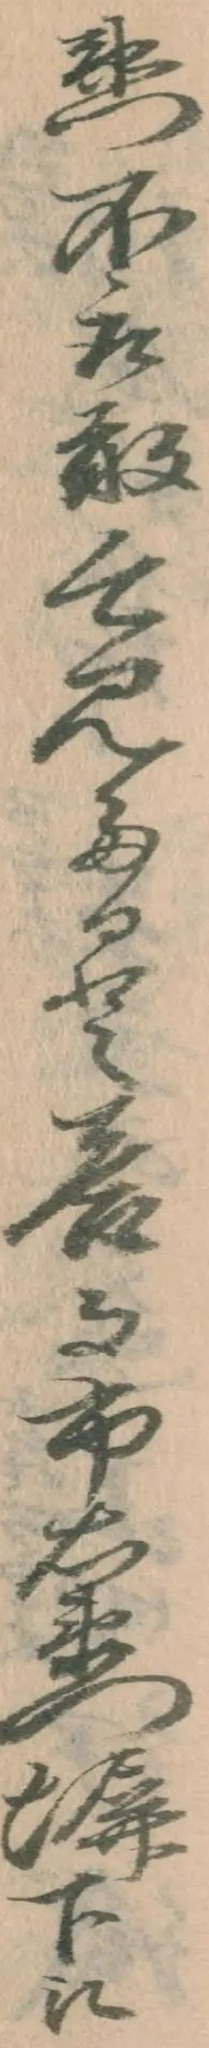衛門不取敢今見多る登答る市右衛門塀下江
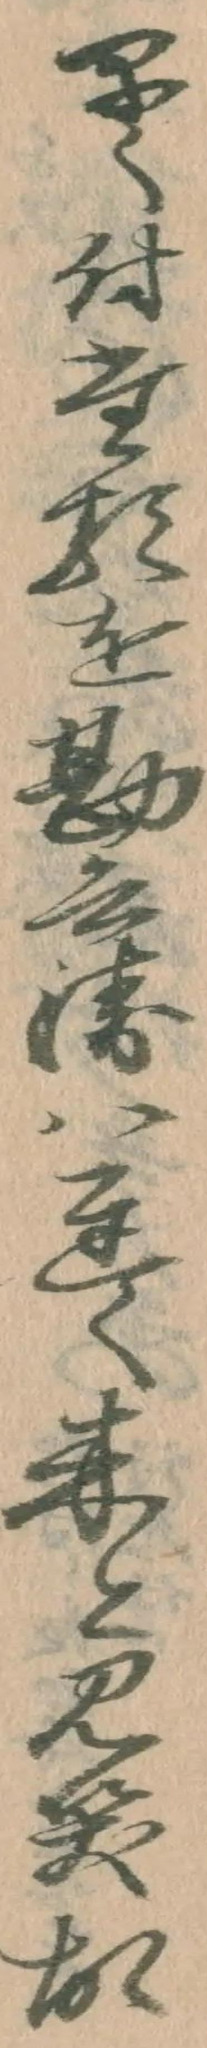早く付堂類を勘兵衛は遅く来と見笑故
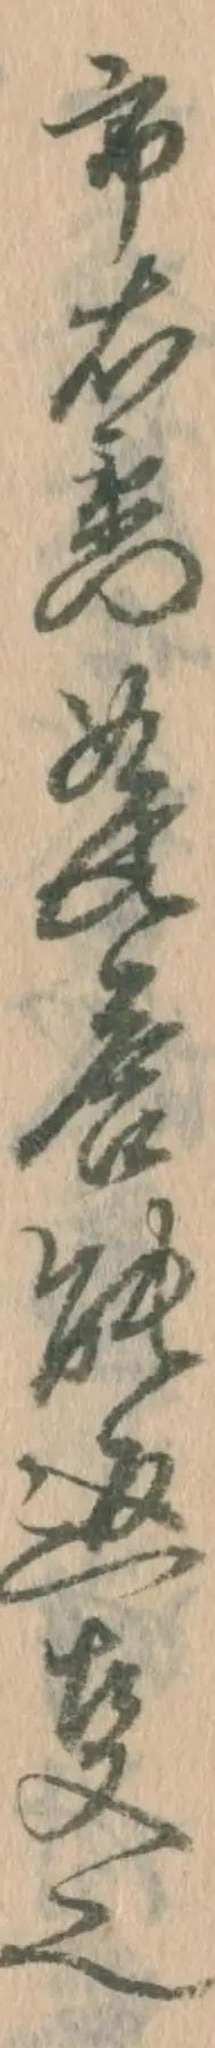市右衛門如此答能返事也
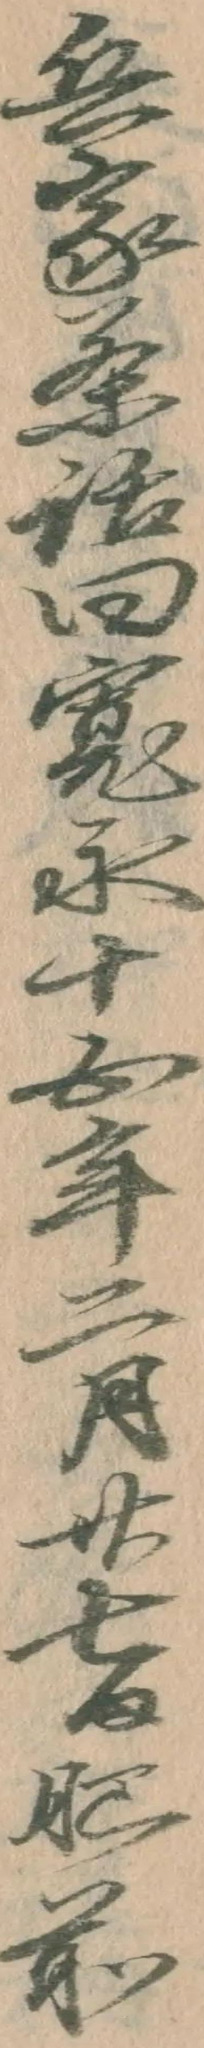兵家茶話曰寛永十五年二月廿七日肥前
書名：切支丹御退治記 49巻. [8]
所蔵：国立国会図書館 National Diet Library, JAPAN
